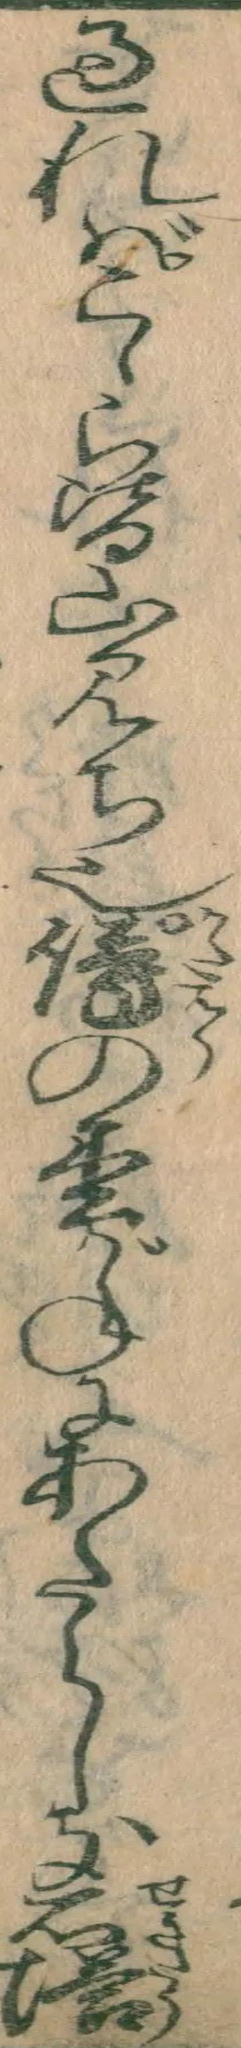過れば。こゝら皆山みち也。傍の松がねにあたらしき石塔
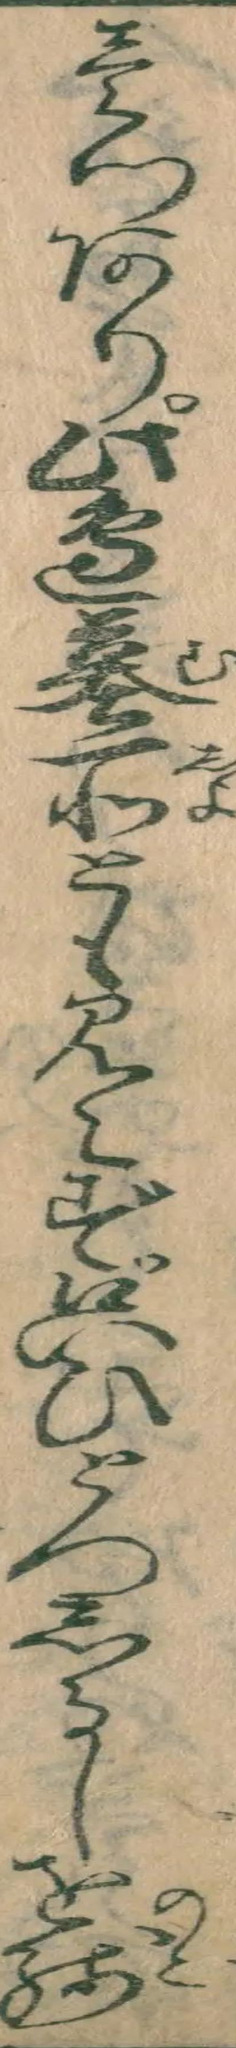壱つあり。此辺墓所とも見えず。只ひとつしるしを残
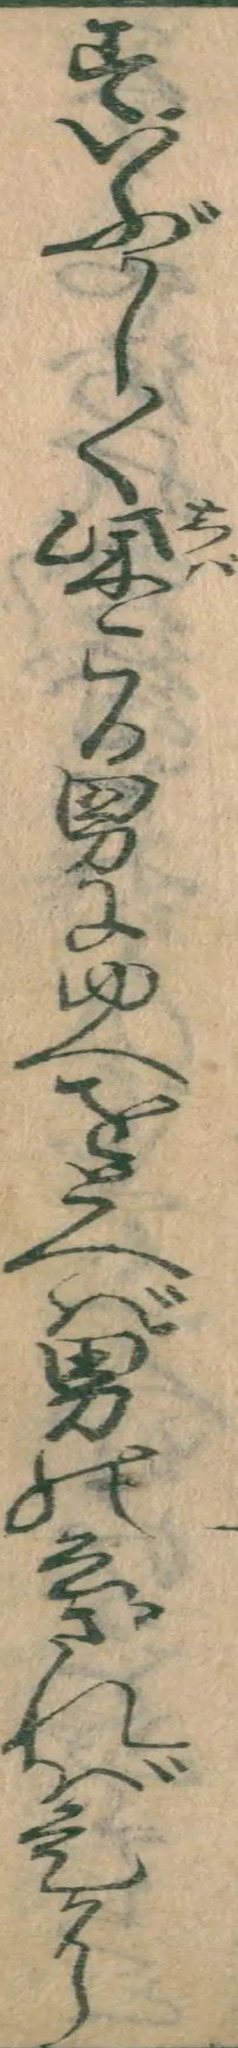すいぶかし〱柴こる男にゆへをとへば男の云。されば是に
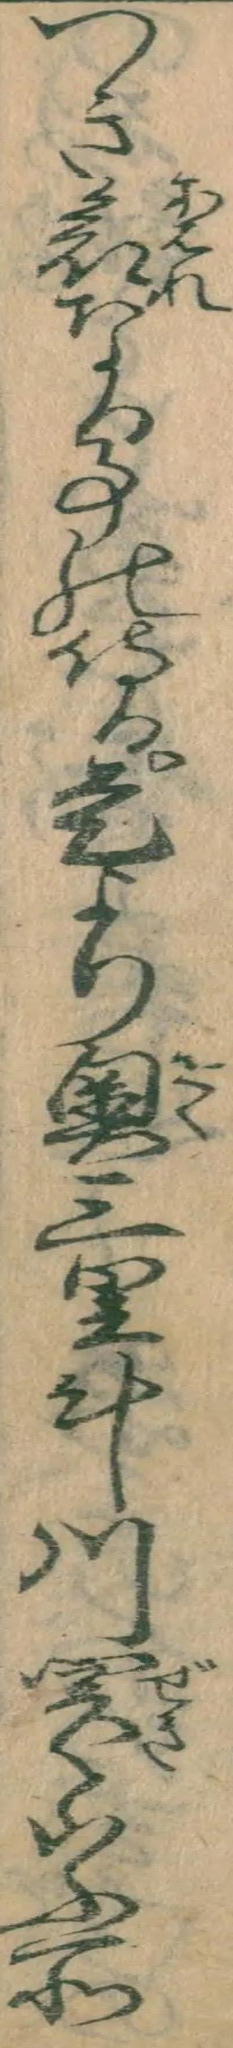つき哀なる事の侍る。是より奥三里斗川関といふ所

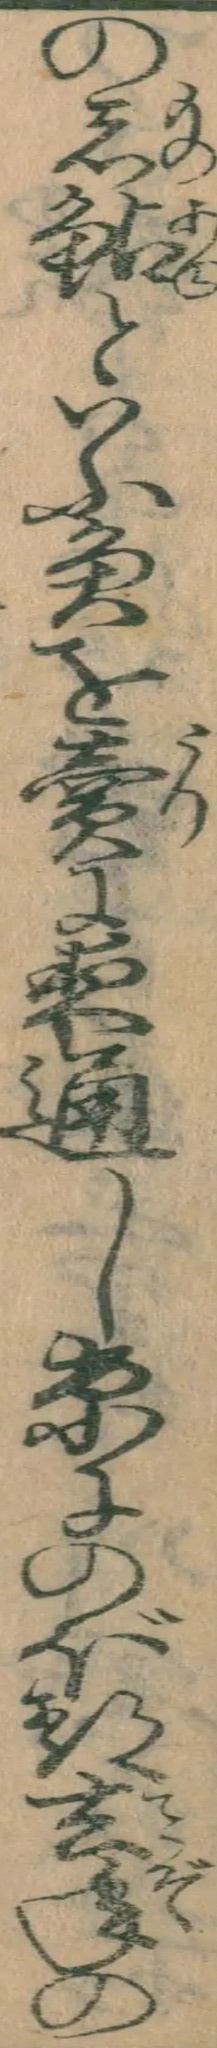の者鮎といふ魚を売に夜通し京にのぼる去年の
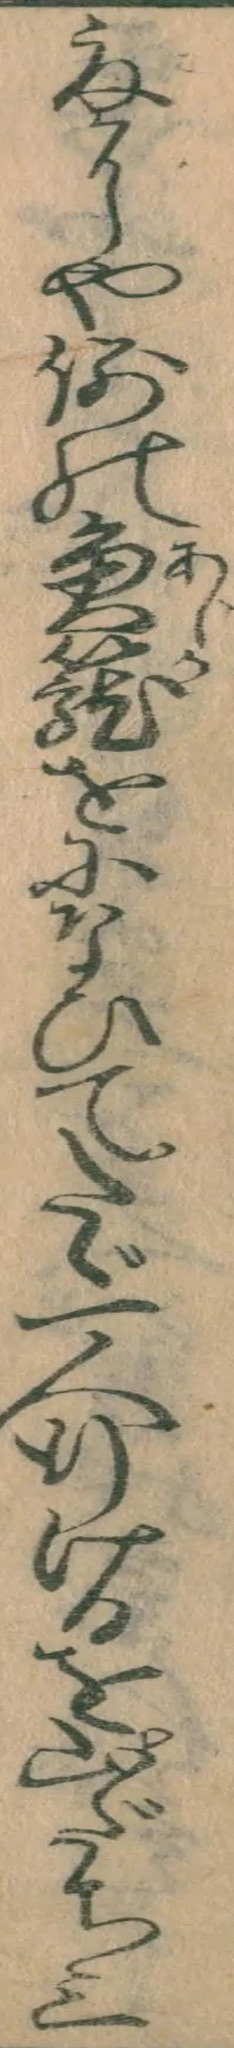夏にや例の魚篭をになひてたゞ一人行けるを。山だち三
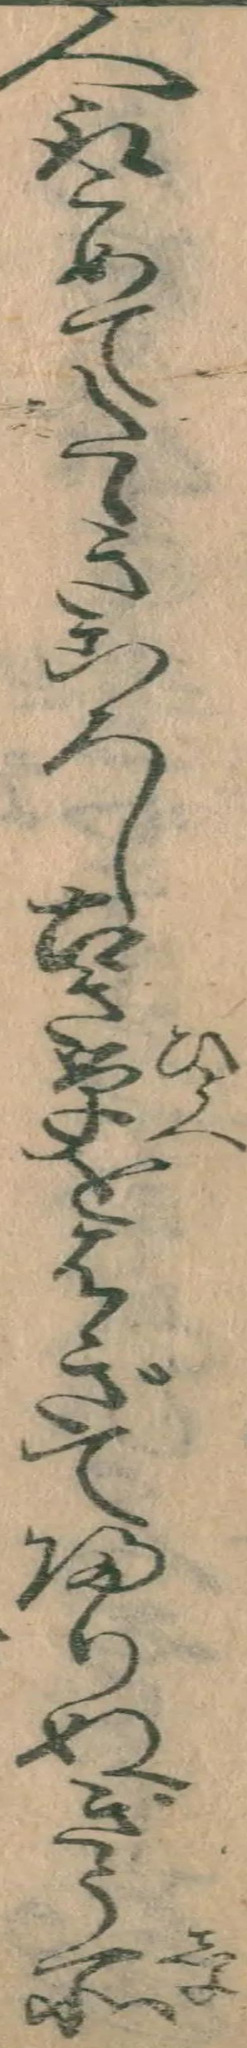人取こめてたゝきころし古き単をはぎて帰りぬきう所
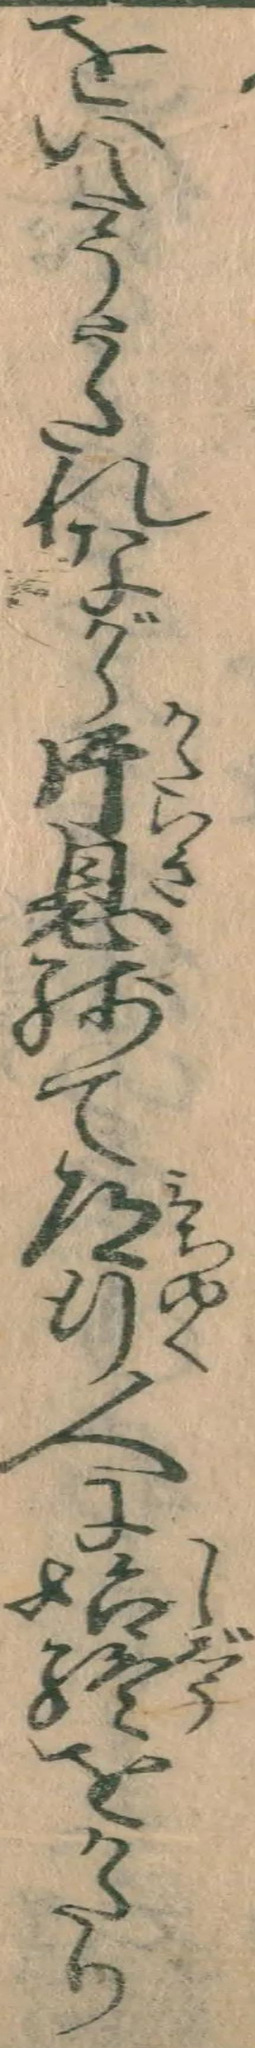をいたううたれながら片息残て道行人に始終をかたり
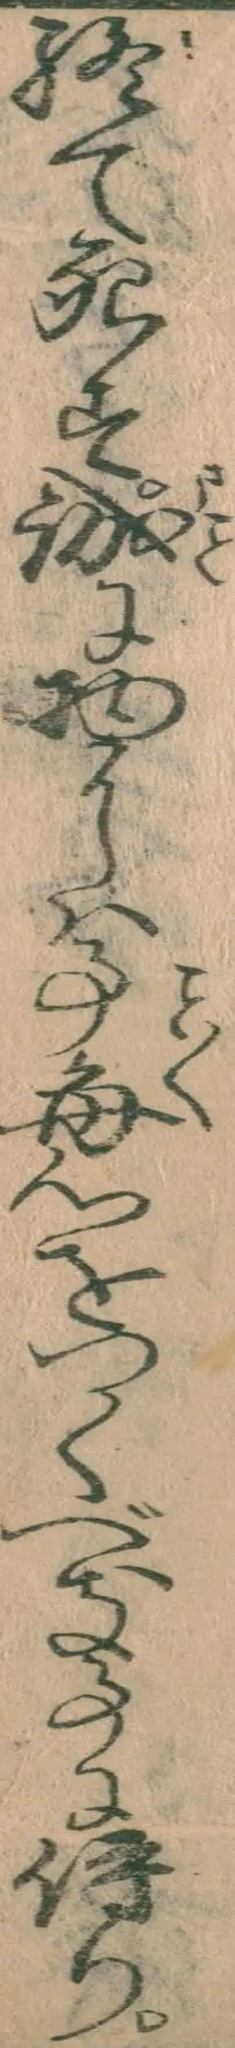終て死す。誠に物には事毎心をつくべき事に侍り。
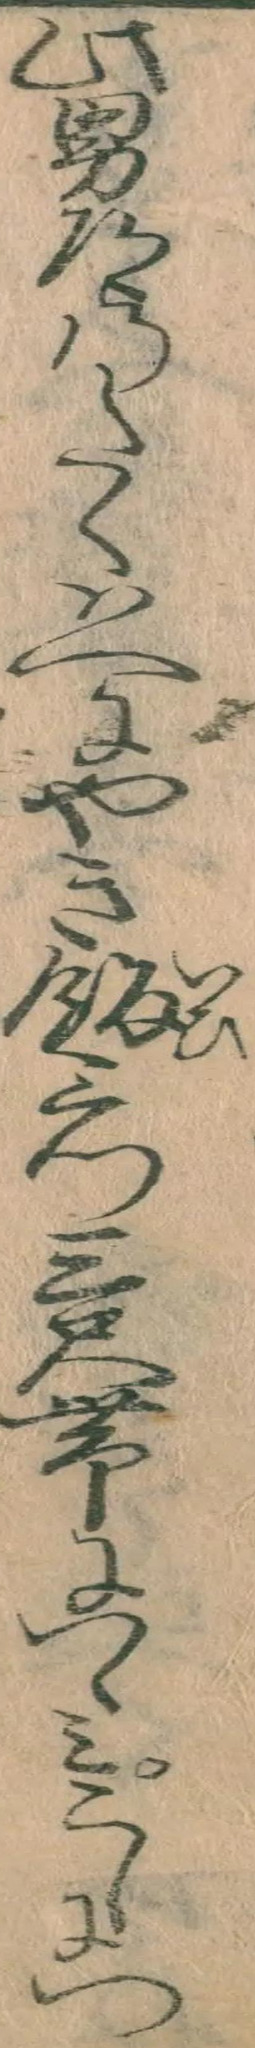此男道のたくはへにやき飯三つ三尺帯につゝみ。こしにつ
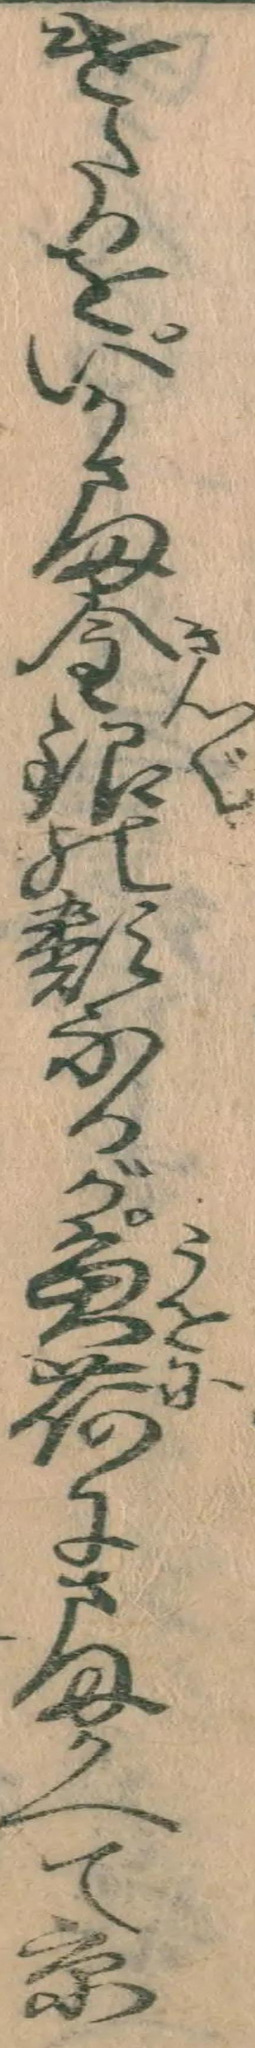けたるを。いかさま金銀の類なるが。魚荷にさまかへて京
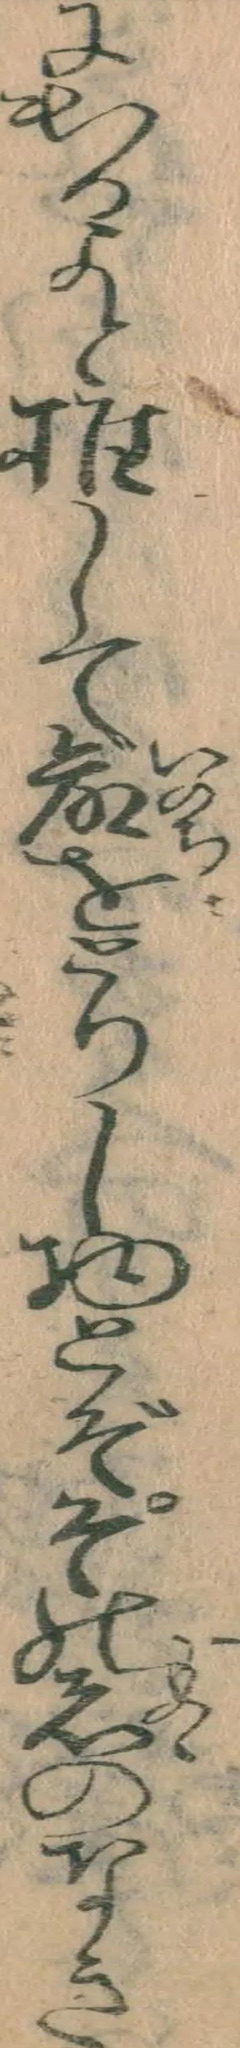に出るよと推して命をとりし物とぞ。その者のなき
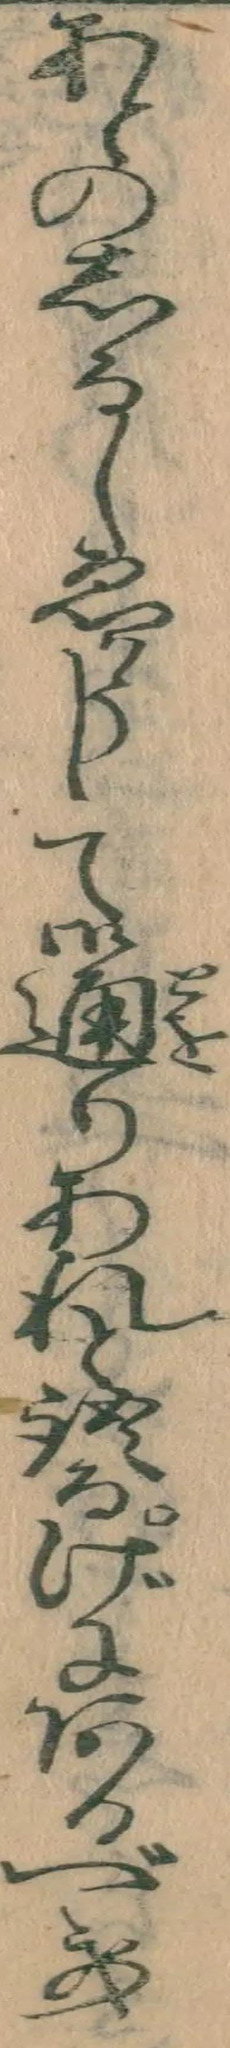あとのしるしゑかうして御通りあれと語る。げにあるべき
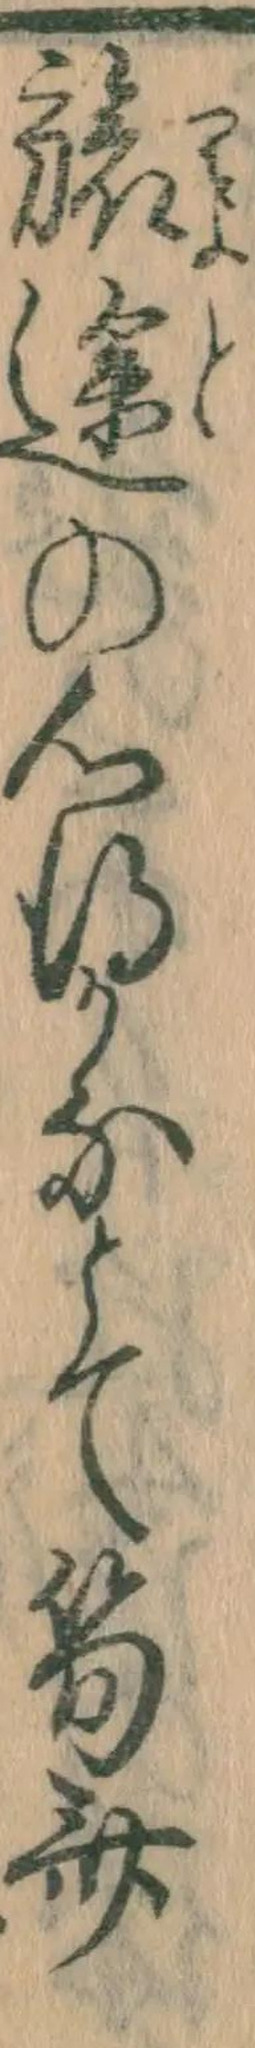旅途の心得かなとて筍斎
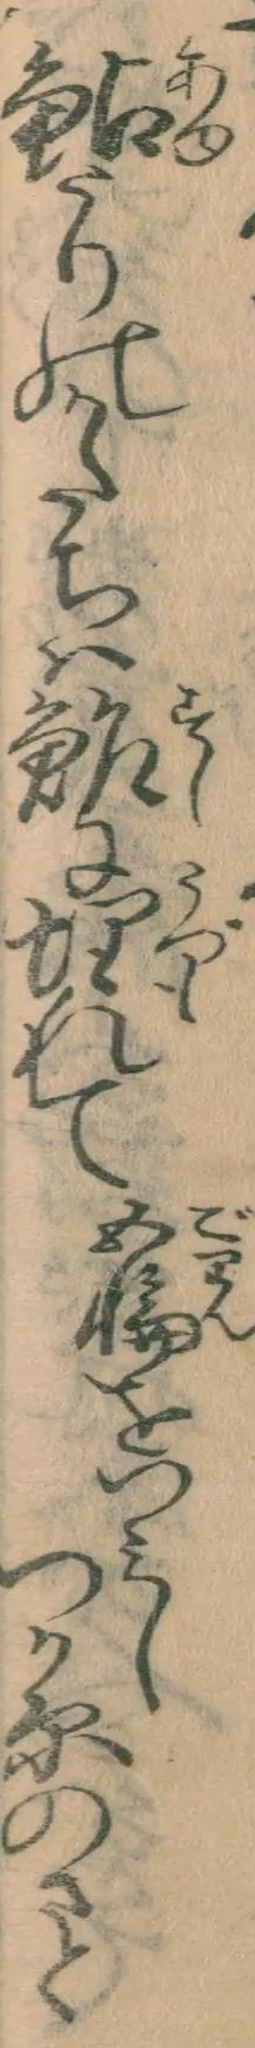鮎うりのかたちは鮓に埋れて五輪をつみしつか原のさと
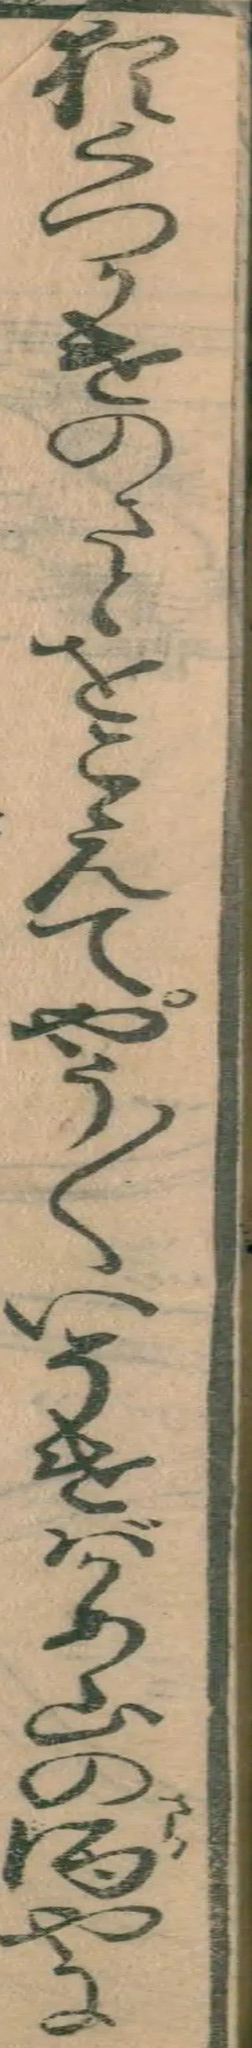猶くつかけのさとをこえて。やう〳〵いそけばかめ山の酒やに
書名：新竹斎 5巻
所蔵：国立国会図書館 National Diet Library, JAPAN
